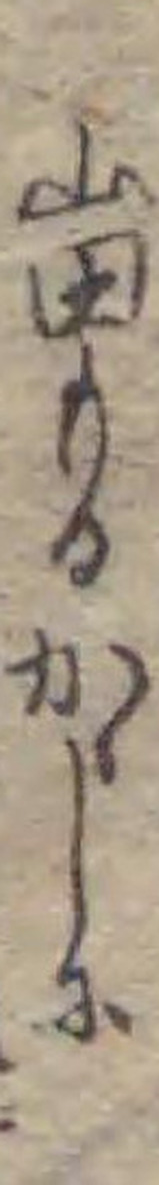山田もるかゝしに
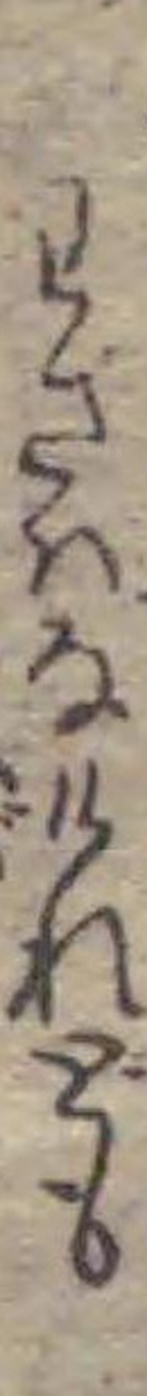わさはなけれども
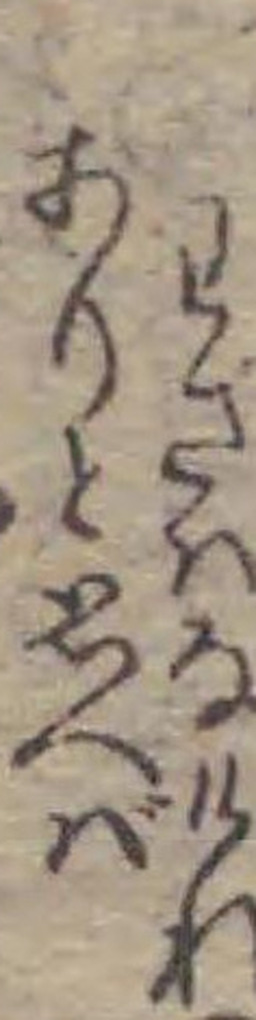ありと思へば
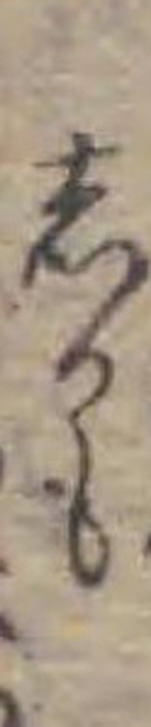しかも
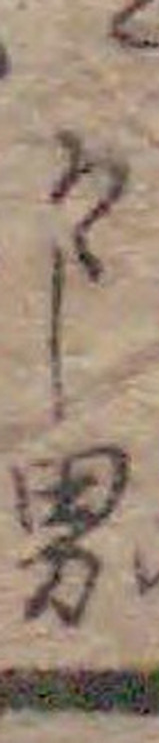かゝし男
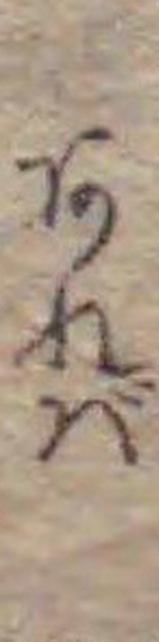あれば
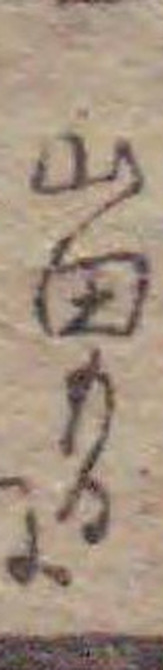山田もるに
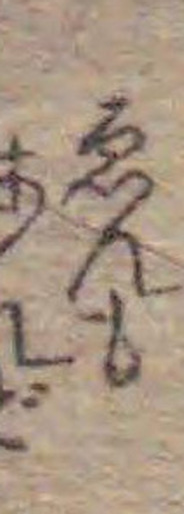ゑんも
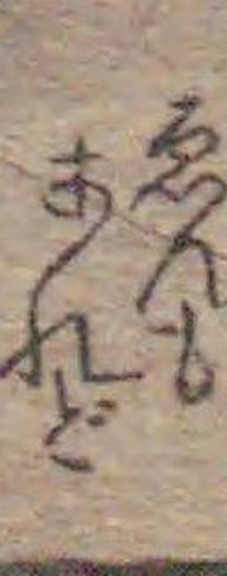あれど
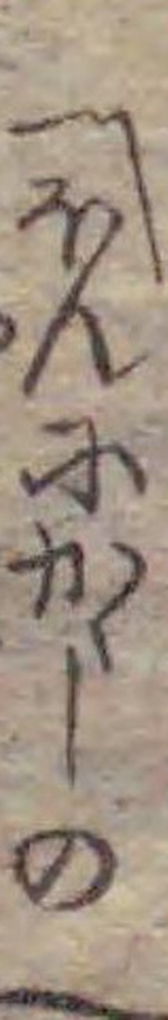〽ほんにかゝしの
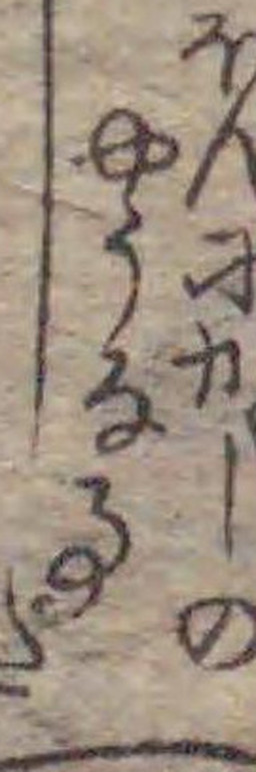やうな事だ

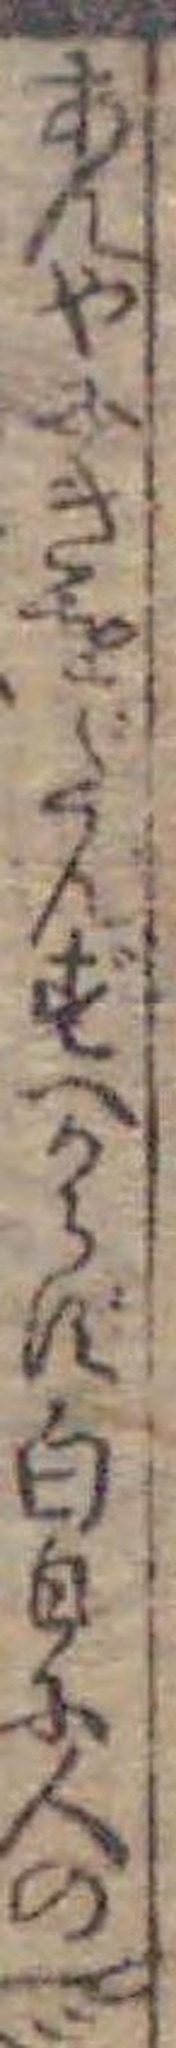あんやにきをだんずへからず白日に人の
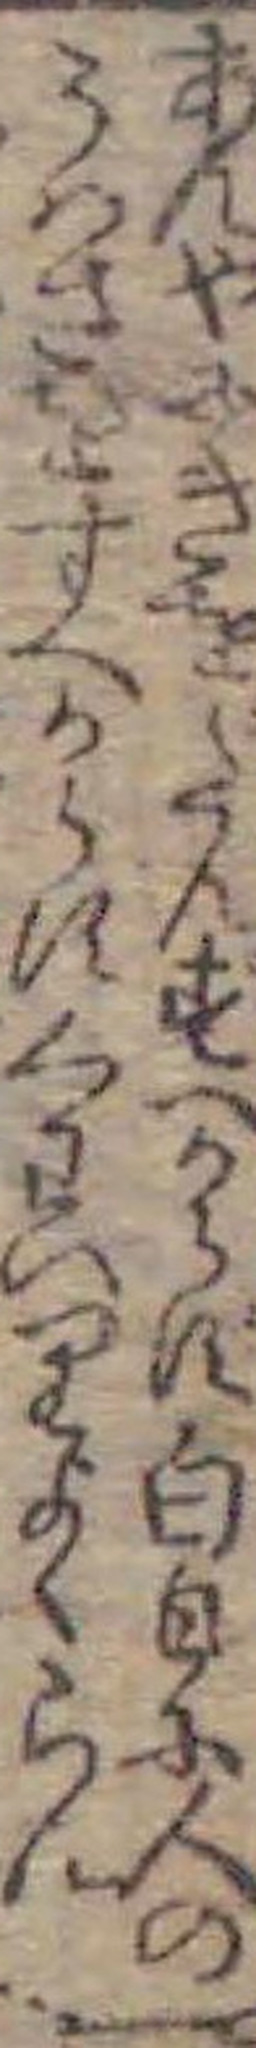うはさをすへからすくわいりよくらん
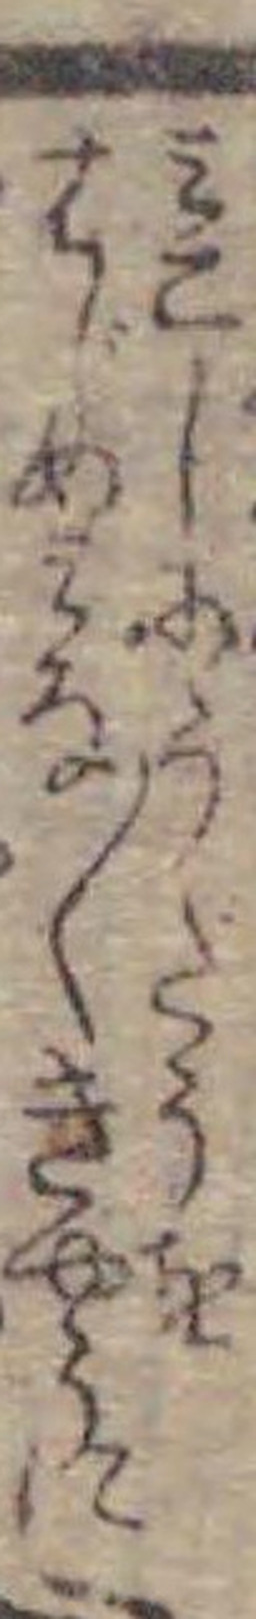はじめみな〳〵きやうに
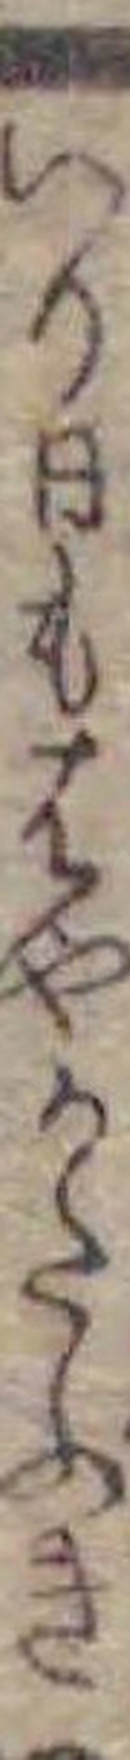いり日もはやかたふき
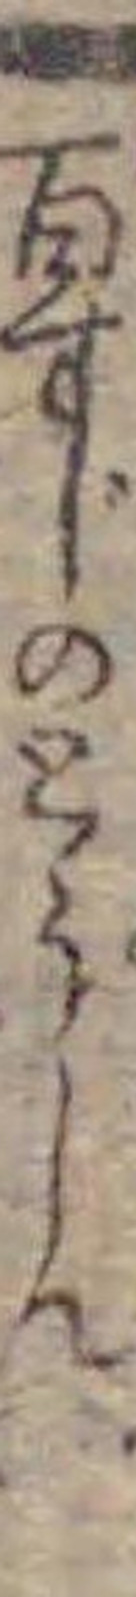百すじのとうしん
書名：怪物つれつれ草 : 2巻
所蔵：国立国会図書館 National Diet Library, JAPAN
